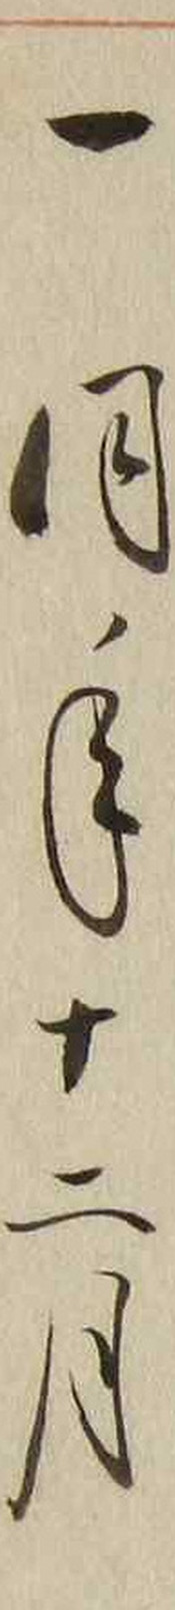一同年十二月
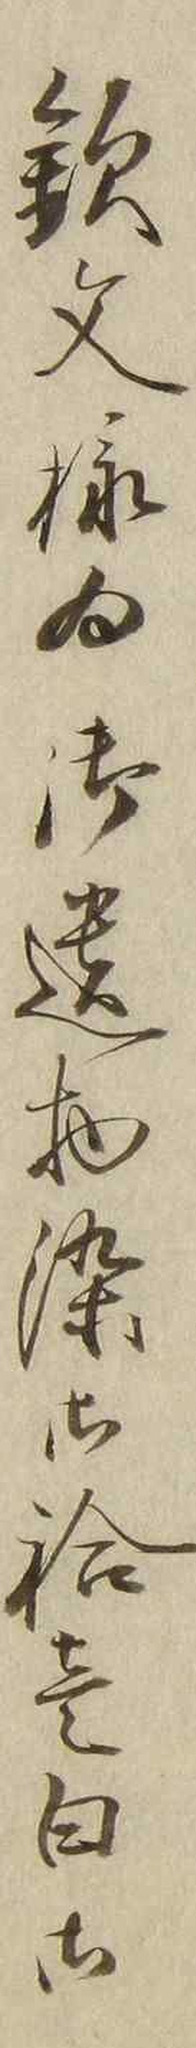欽文様為御遺物染御袷壱白御

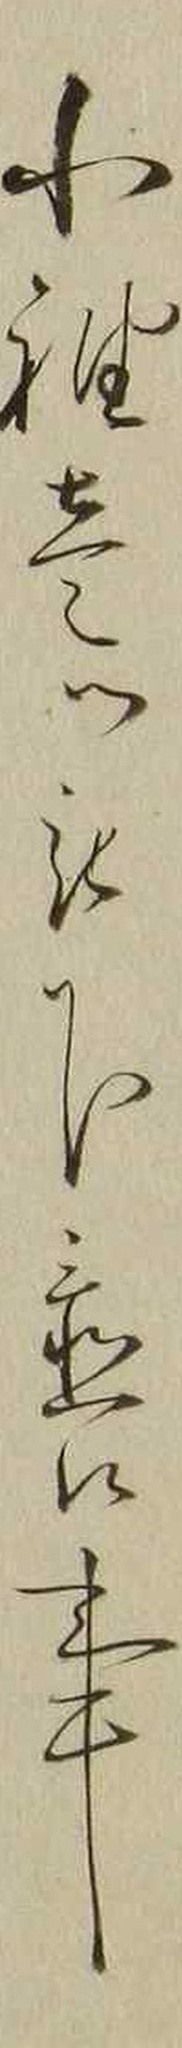小袖壱つ被下置候事
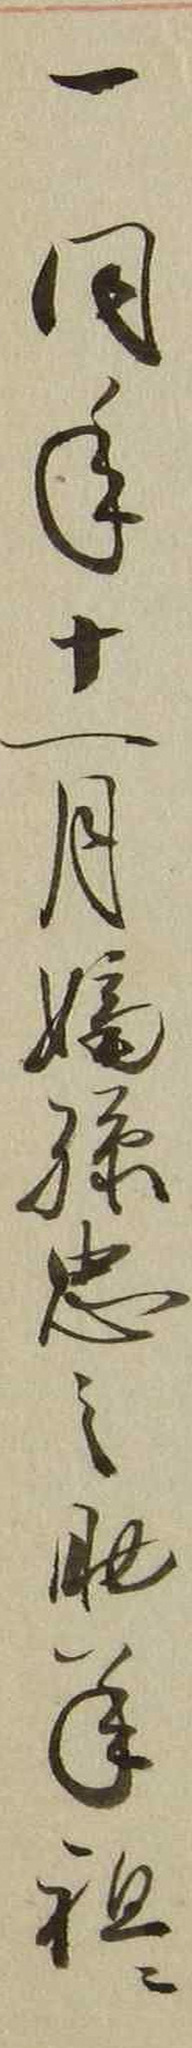一同年十一月嫡孫忠之助年祖
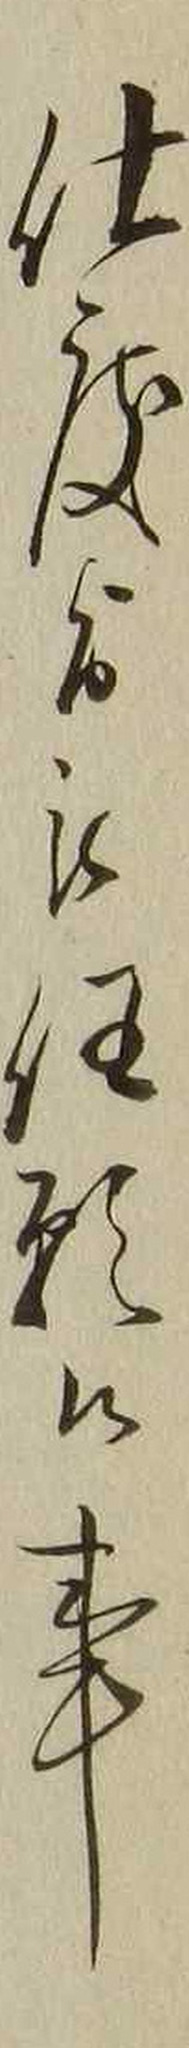仕度旨被任願候事
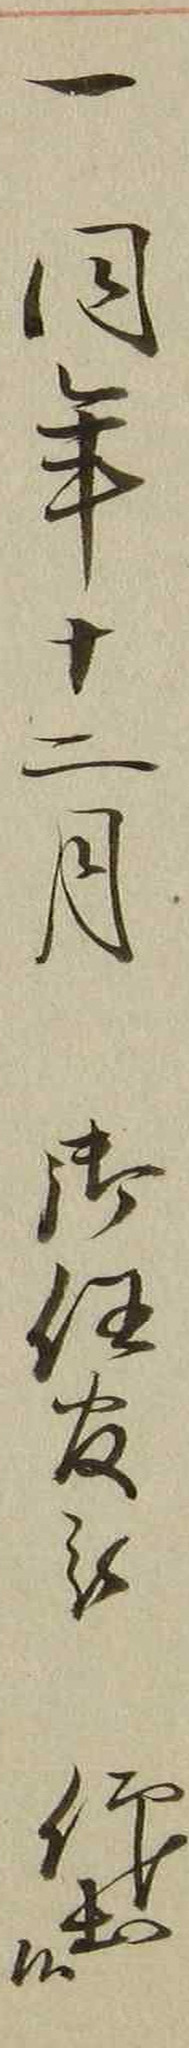一同年十二月御任官被仰出候
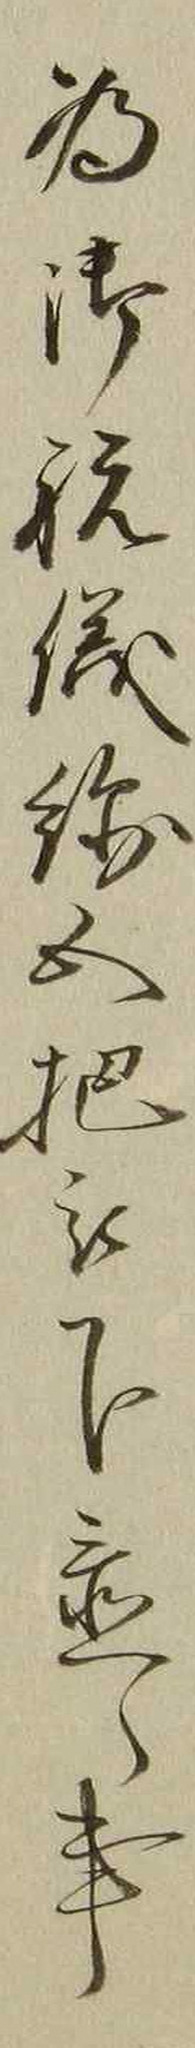為御祝儀綿五把被下置候事
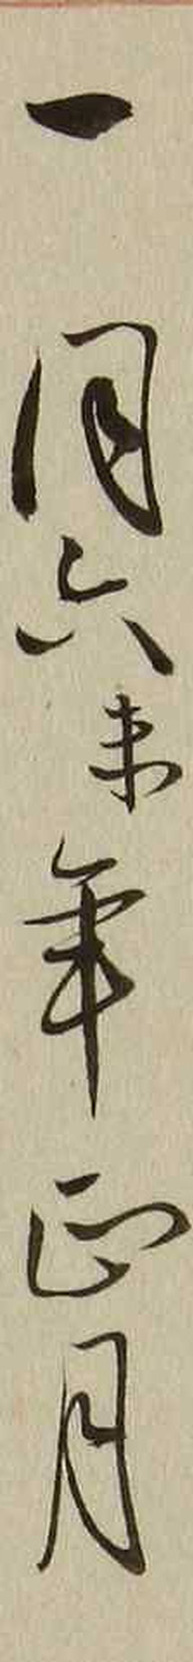一同六未年正月
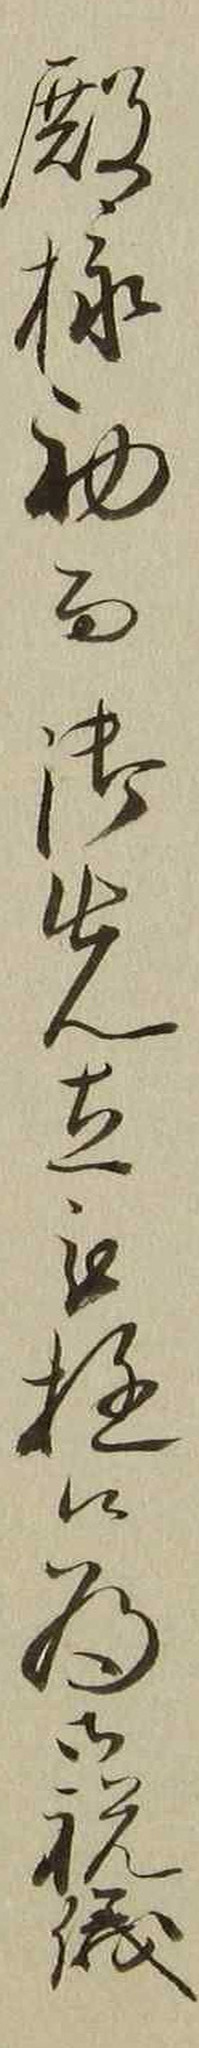殿様初而御先立被遊候為御祝儀
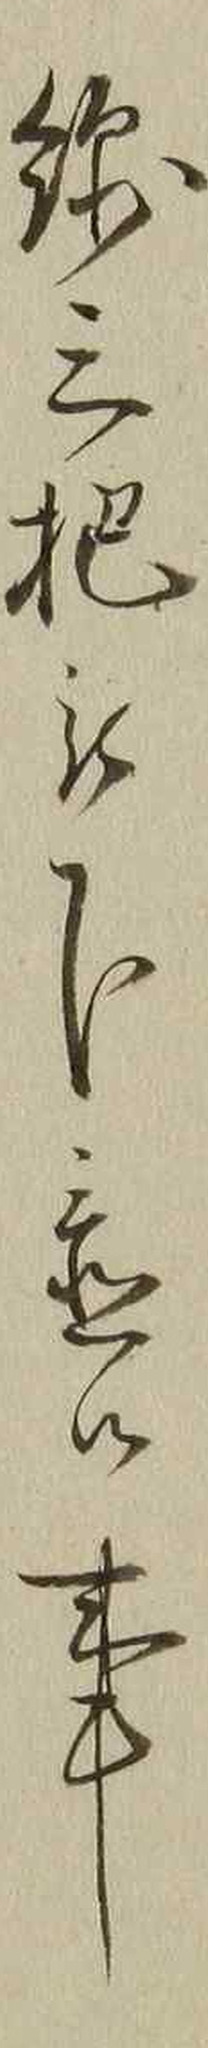綿三把被下置候事
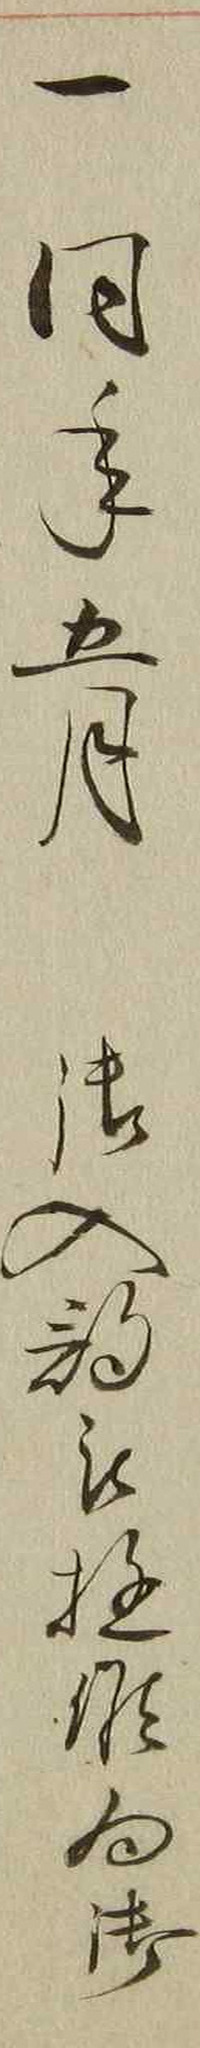一同年五月御入部被遊候為御
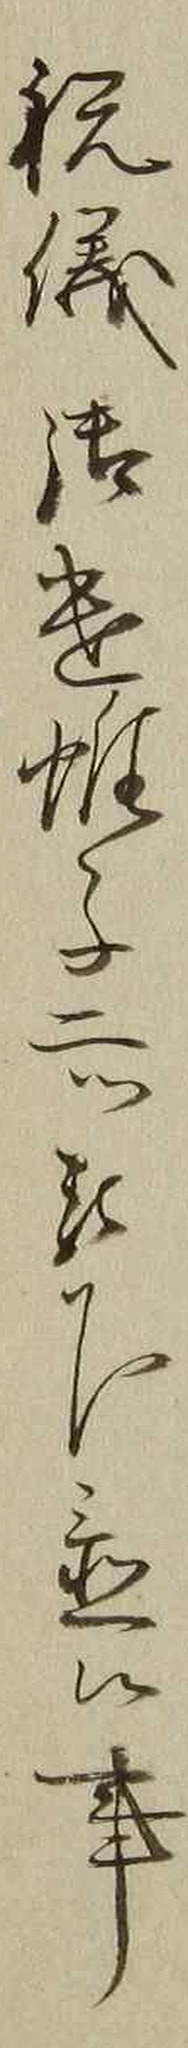祝儀御継帷子二つ被下置候事
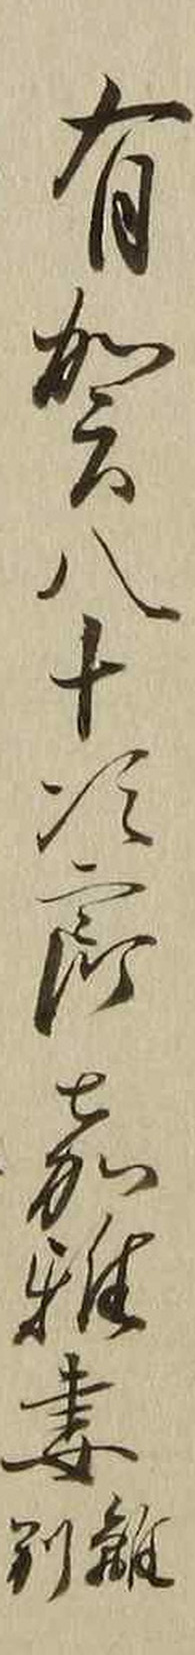有賀八十次郎嘉雅妻離別
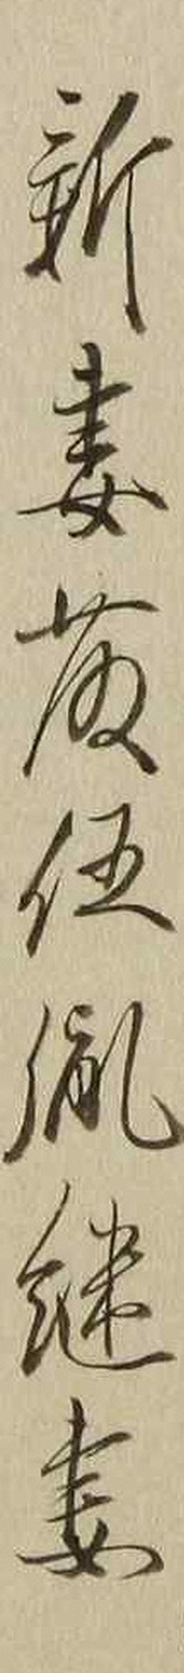新妻藤伍胤継妻
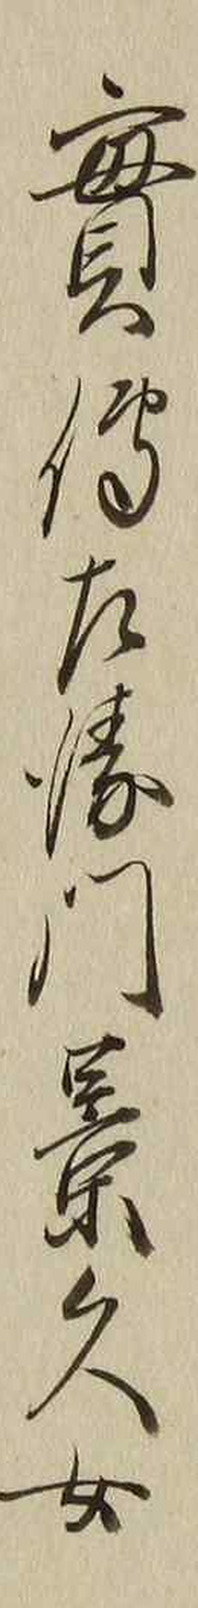実伝左衛門景久女
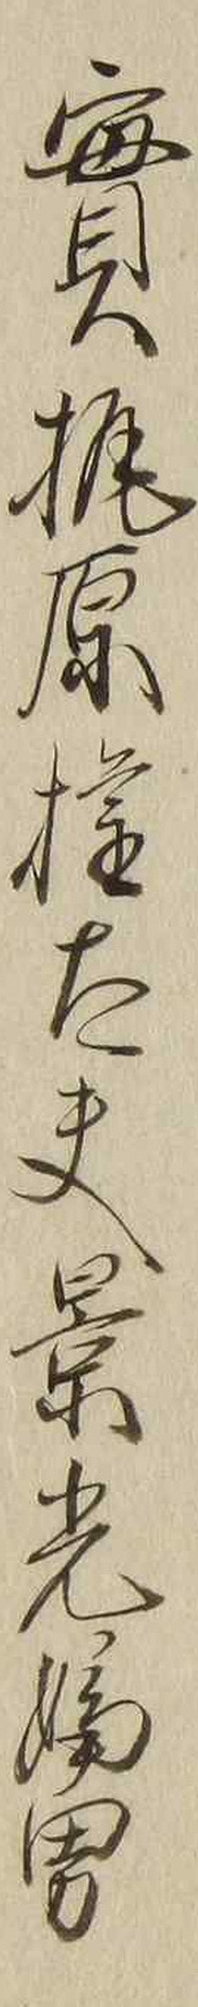実梶原権太夫景光嫡男
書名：諸士系譜　巻之103　か之部11
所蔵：会津若松市立会津図書館
